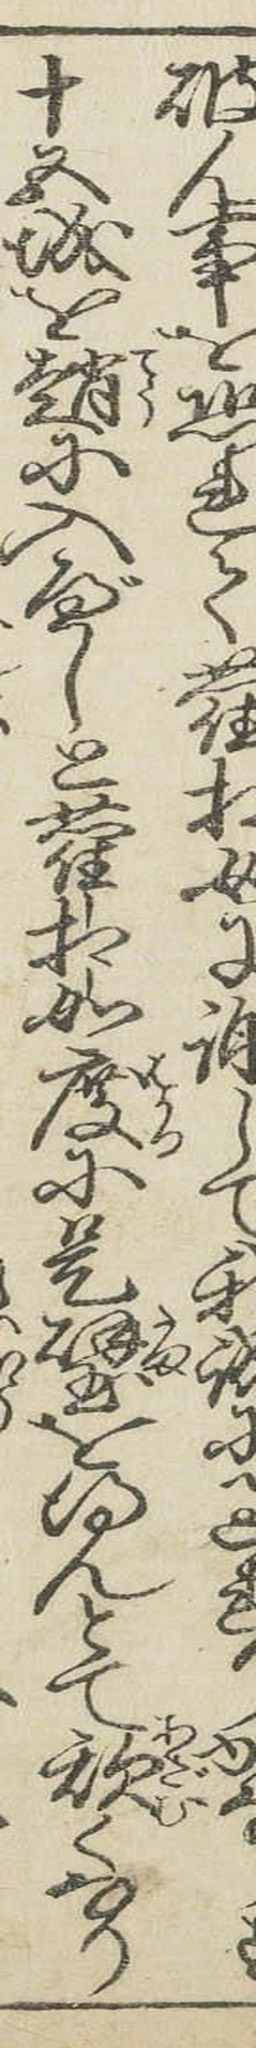十五城を趙に入べしと藺-相-如度に是璧を得んとて欺くなり
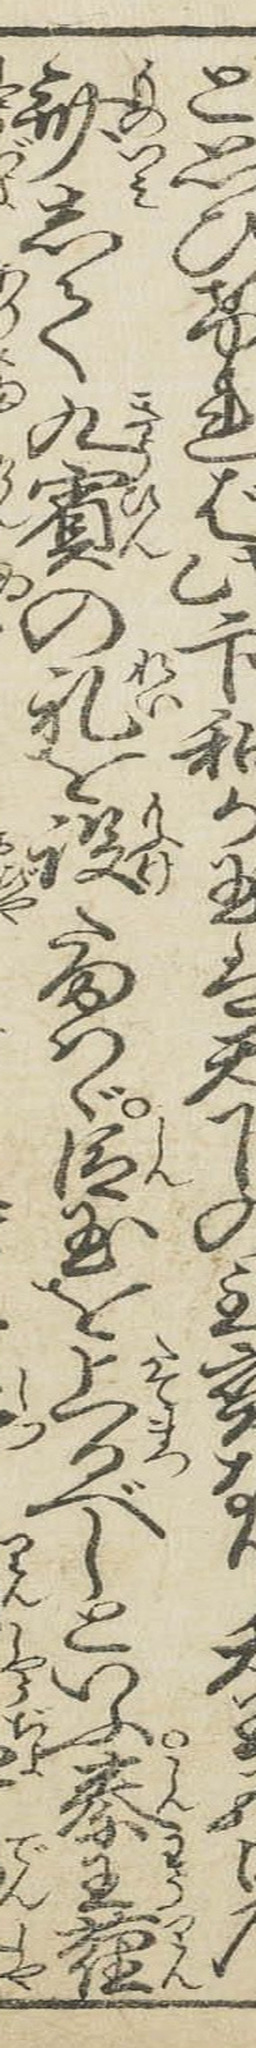斎して九賓の礼を設たまはゞ。臣玉を上るべしといふ。秦王藺
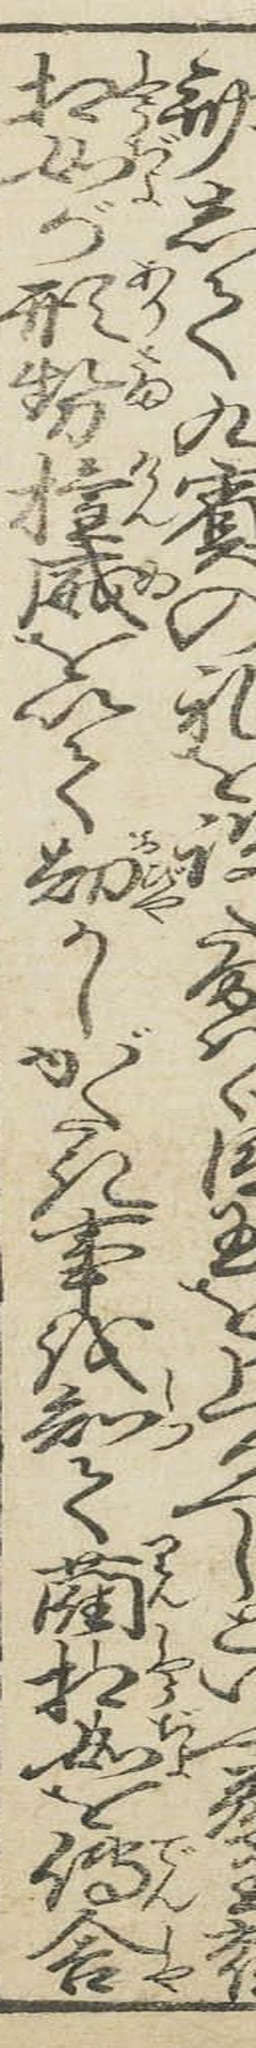相如が形勢権威を以て劫かしがたき事を知て藺相如を伝舎
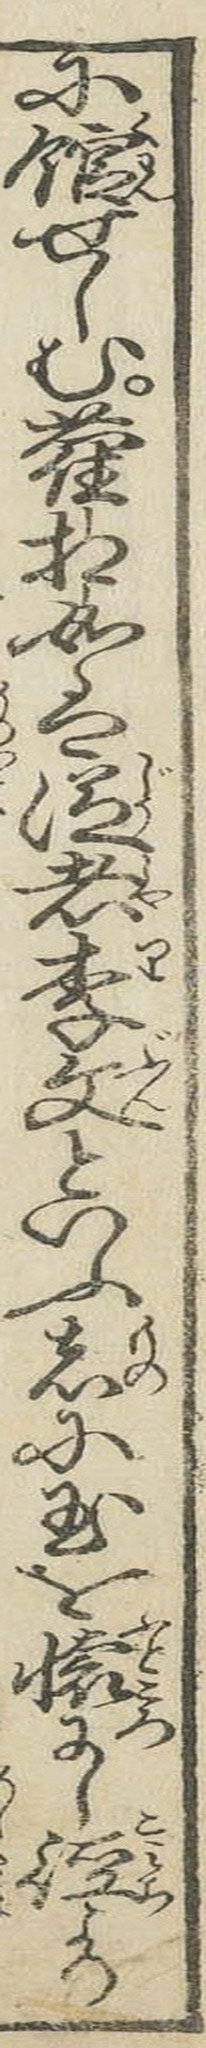に館せしむ。藺-相-如は従者李文といふ者に玉を懐にし径より
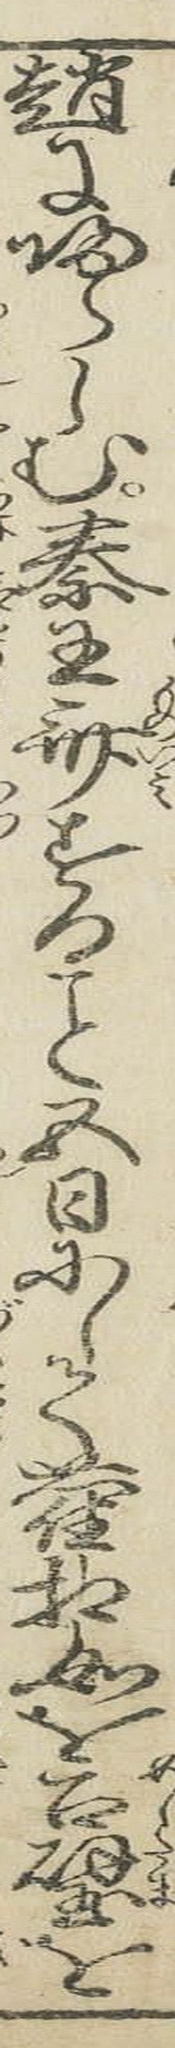趙に帰らしむ。秦王斎すること五日にして藺-相-如を召璧を
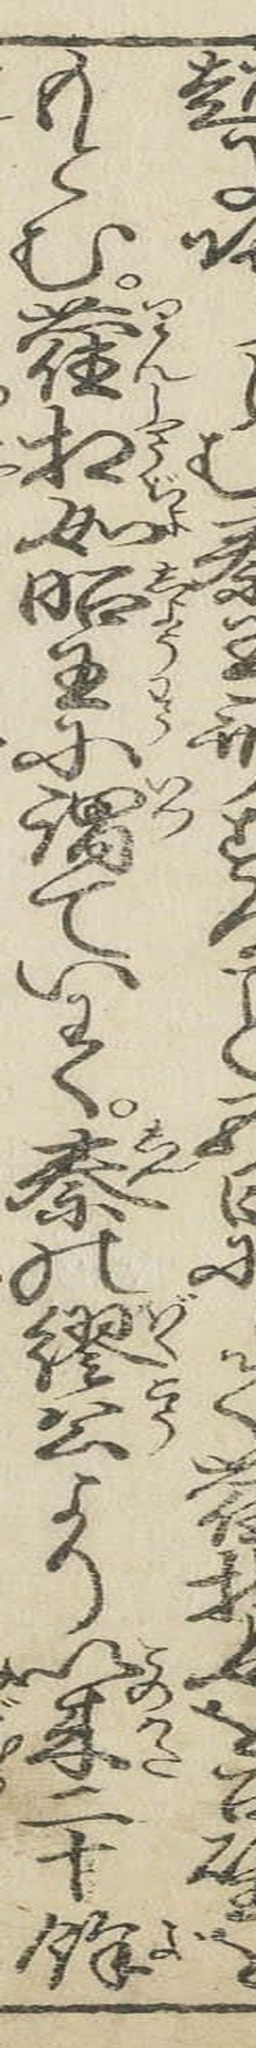もとむ。藺相如昭王に謂ていわく。秦の繆公より以来二十余
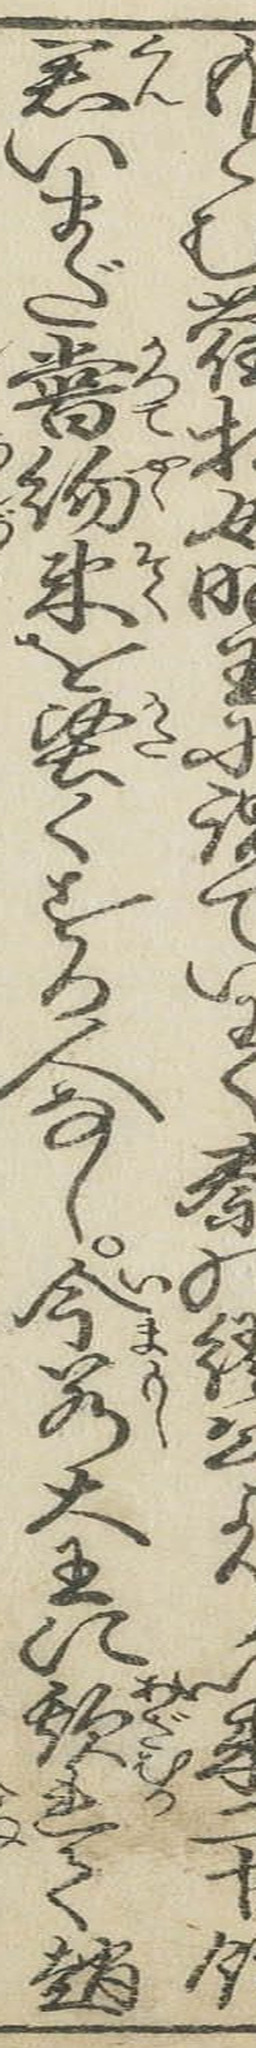君いまだ嘗約束を堅くする人なし。今若大王に欺れて趙
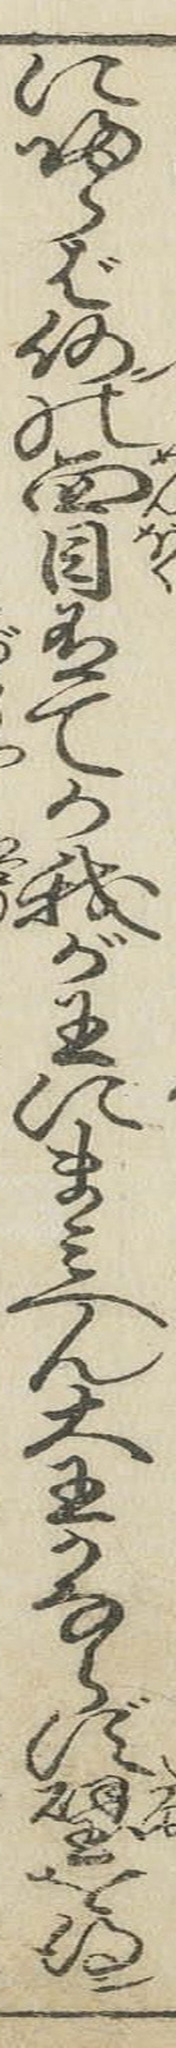に帰らば何の面目有てか我が王にまみへん大王かならず璧を得
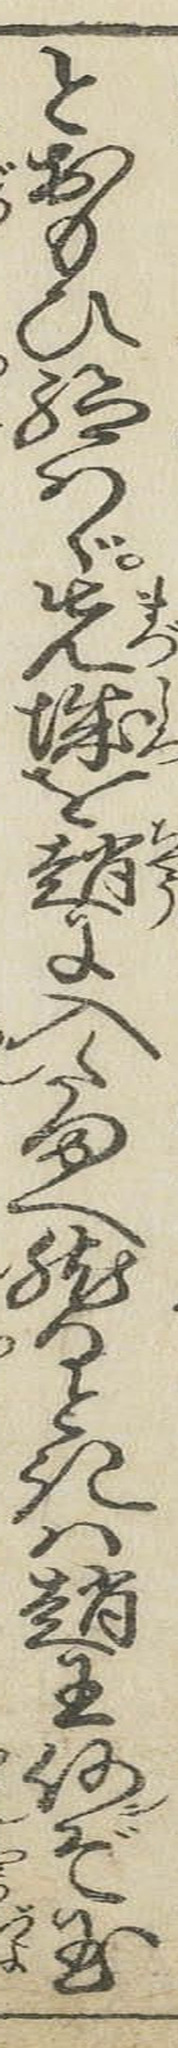とおもひ給はゞ。先城を趙に入たまへ然るときは趙王何ぞ玉
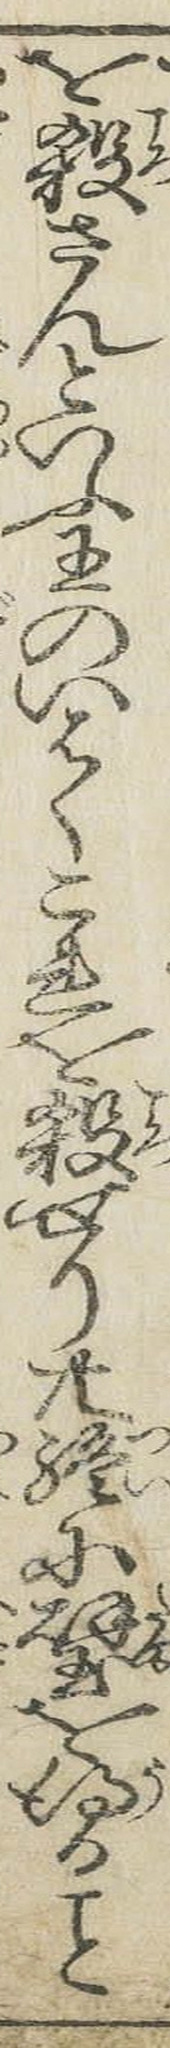を殺さんといふ王のいはくこれを殺せり共終に璧を得ること
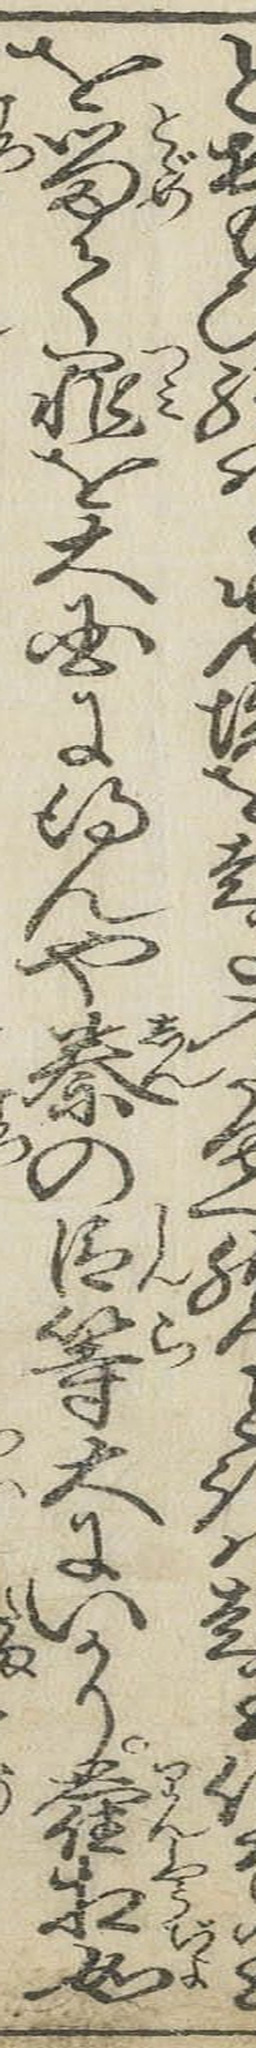を留て罪を大国に得んや秦の臣等大にいかり。藺相如
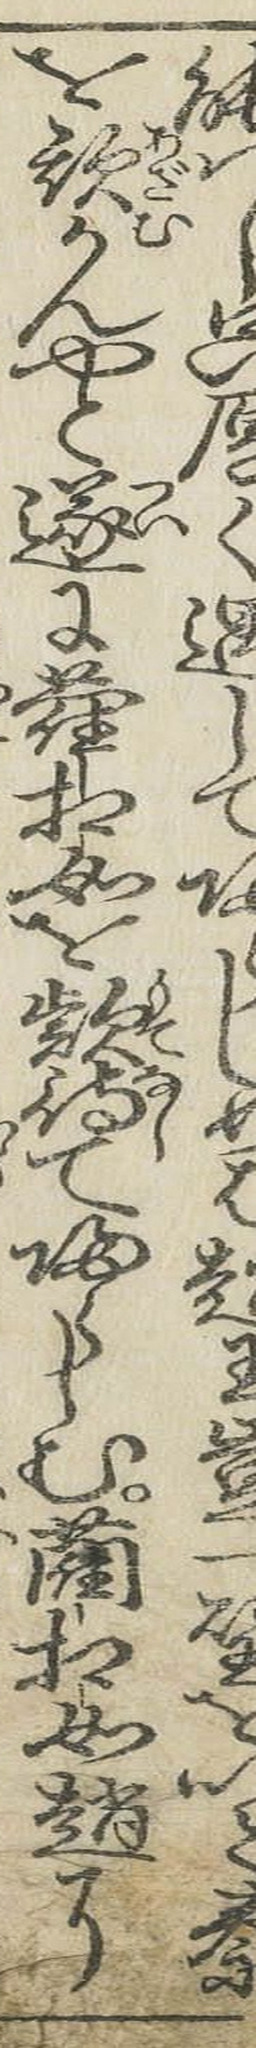を欺かんやと遂に藺-相-如を款待て帰らしむ。藺-相-如趙に
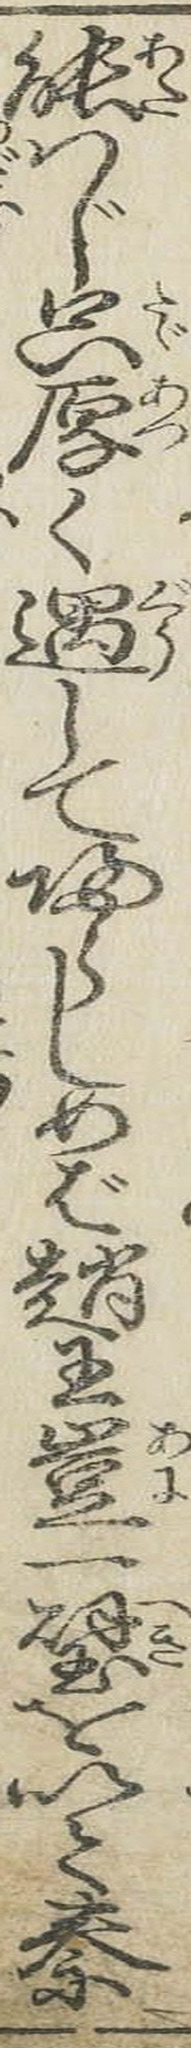能はじ只厚く遇して帰らしめば趙王豈一璧を以て秦
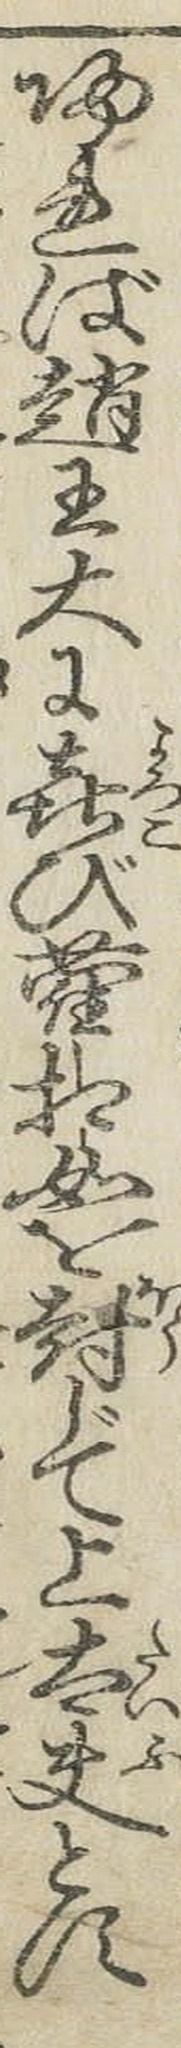帰れば趙王大に喜び藺-相-如を封じて上太夫とす
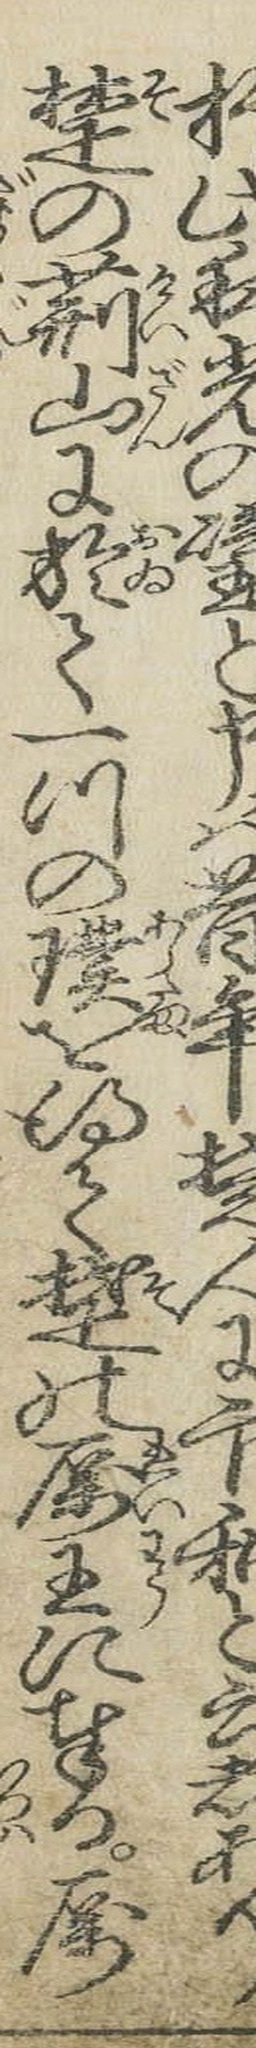楚の荊山に於て一つの璞を得て楚の厲王に奉る。厲
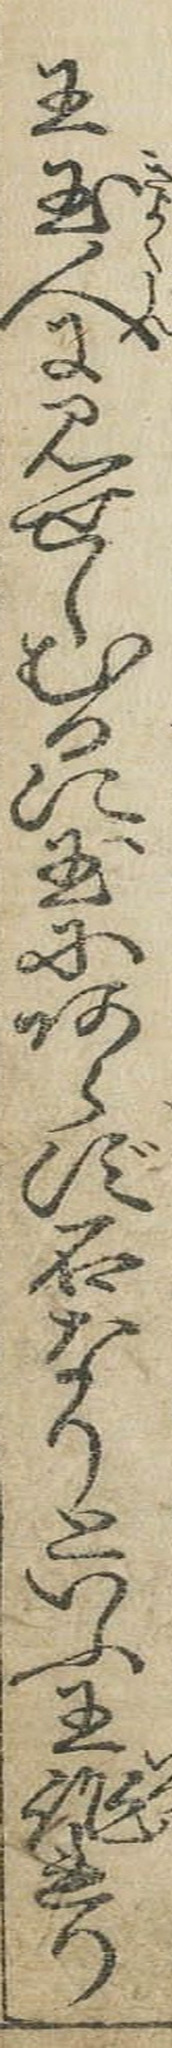王玉人に見せしむるに玉にあらず石なりといふ王詐れり
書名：絵本写宝袋 9巻 6之巻
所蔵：東京学芸大学教育コンテンツアーカイブ
